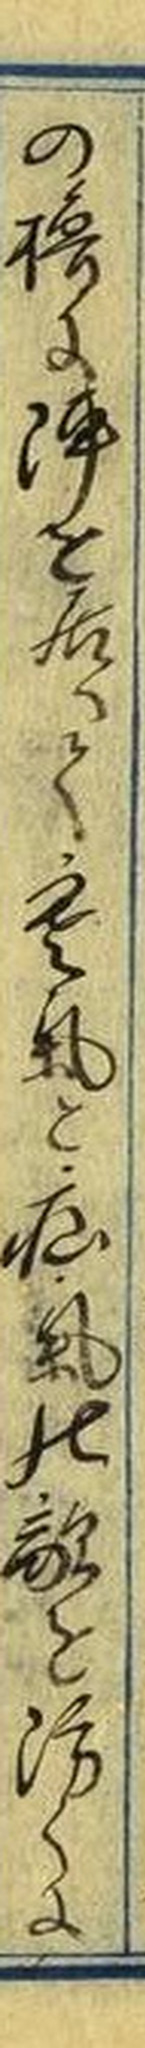の櫓に陣を居へて寒気と疝気の敵を防くに
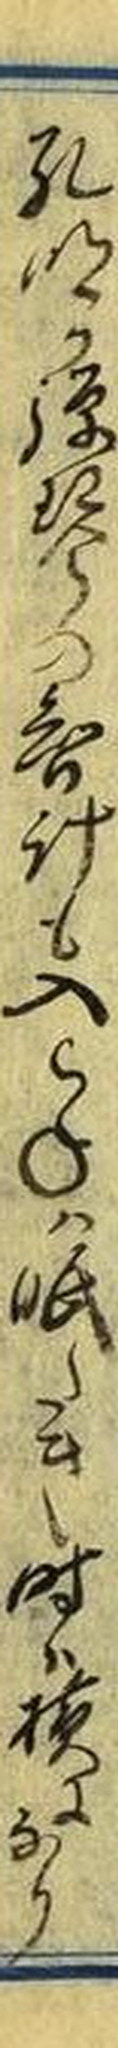孔明か弾琴の智計も入らねは眠たき時は横になり
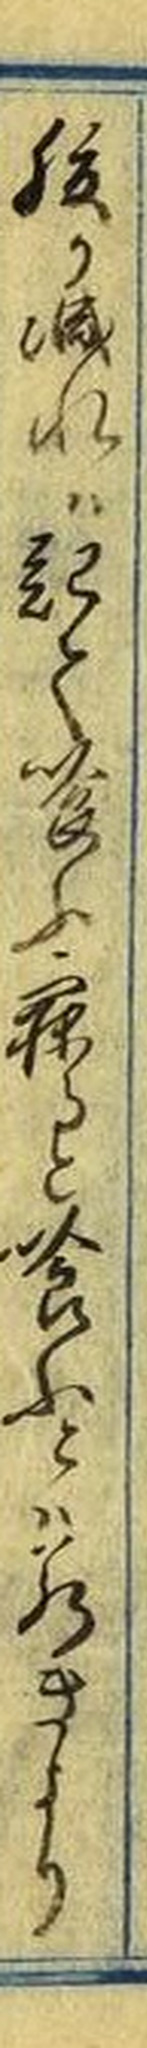腹か減れは起て喰ふ寝ると喰ふとは若きより
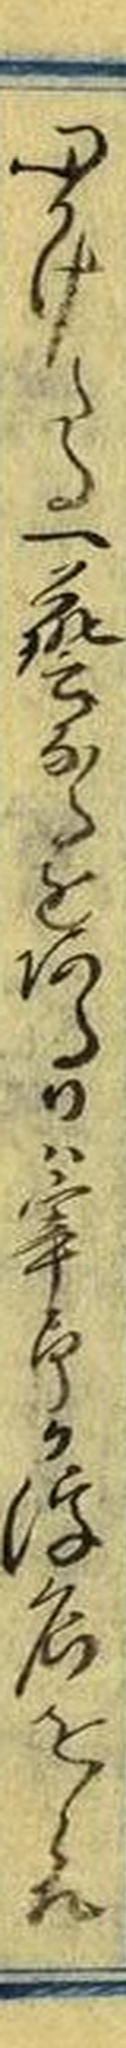心かけたる一芸なるをある日は宰予か浮名を取
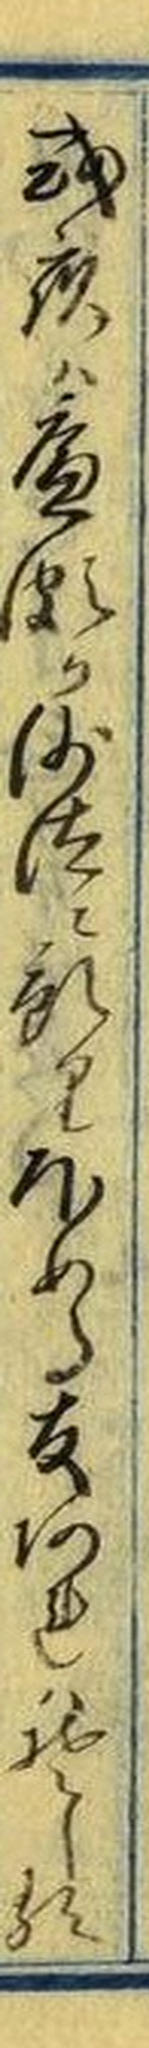或夜は廉頗か沙汰に預りほめる友あれはそしる
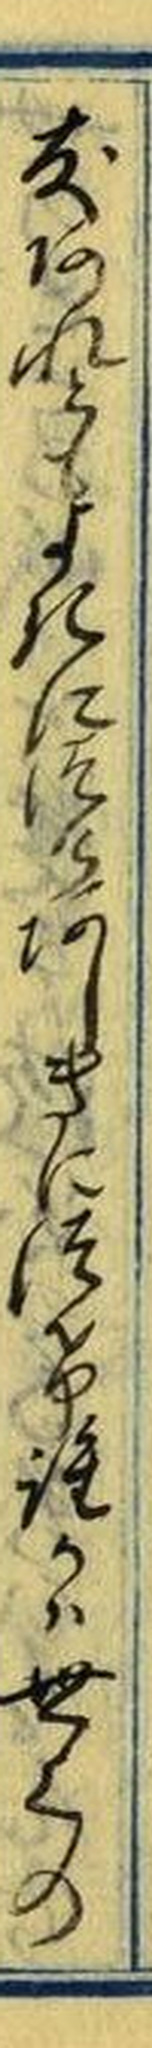友あれともよきにつけあしきにつけ誰かは世上の
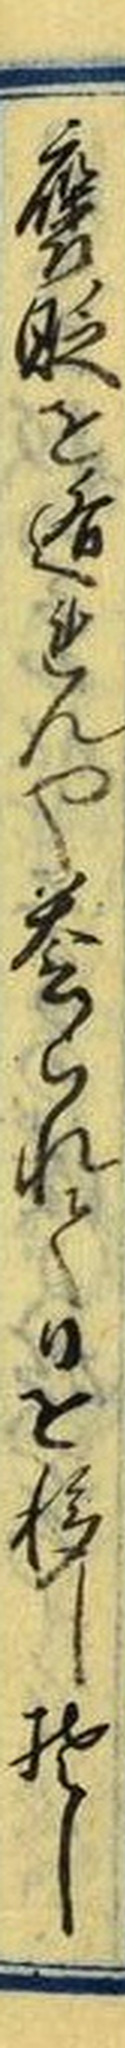褒貶を遁れんや誉られて日を移しそし
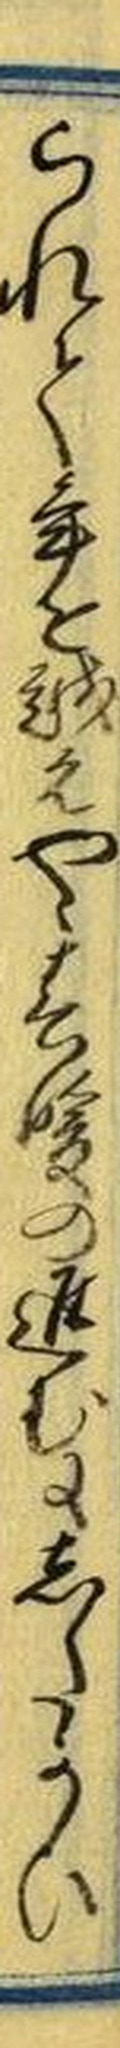られて年を越えやゝ春暖の進むにしたかひ
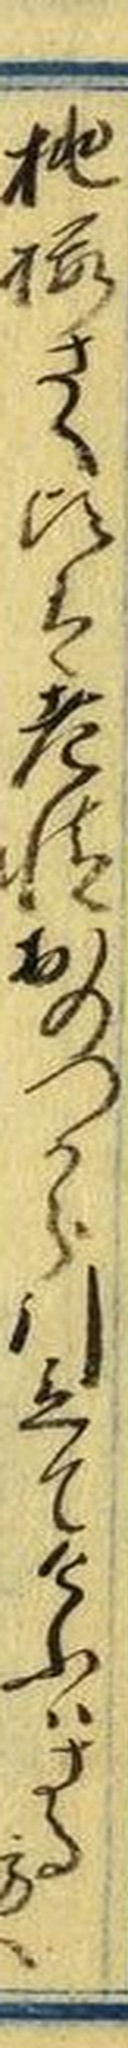桃桜さく頃は老情おのつから引立てけふはさる方へ
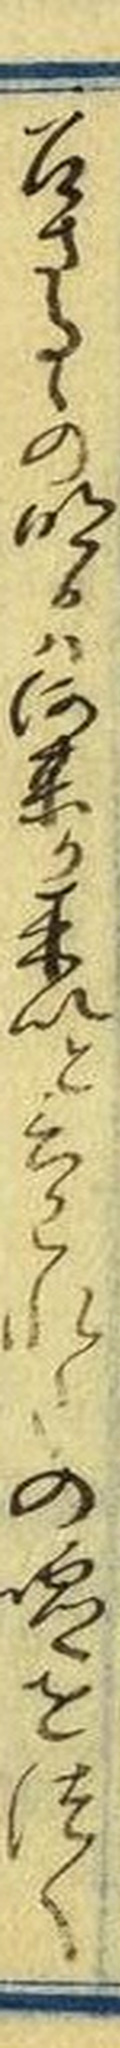召さるゝの明日は何某か来いと言われたの噓をつく
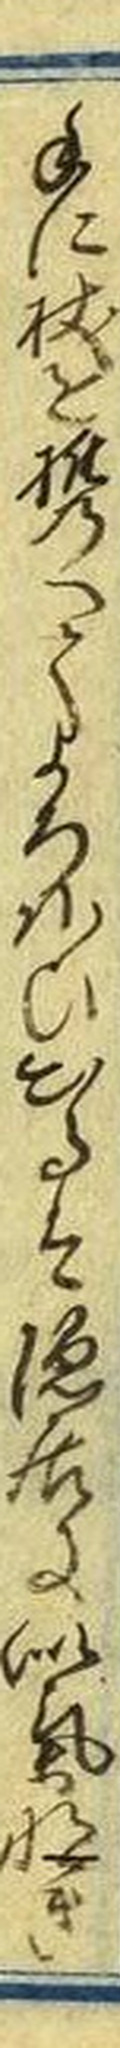手に杖を携へてよろほひ出るは隠居に似気なき
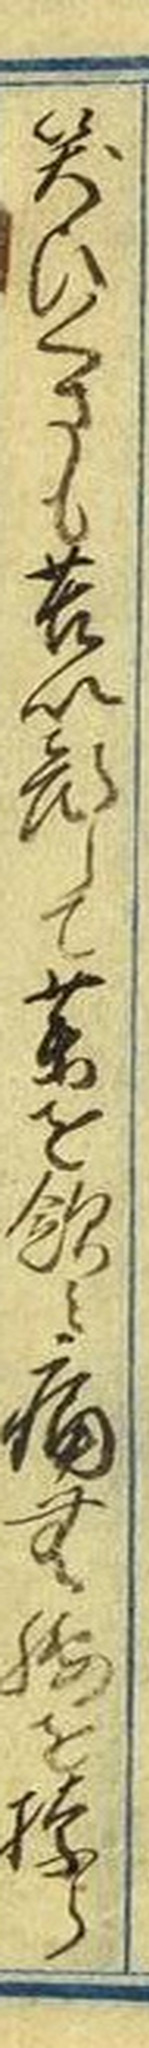笑ひくさも苦い顔して薬を飲み痛む腰を捺ら
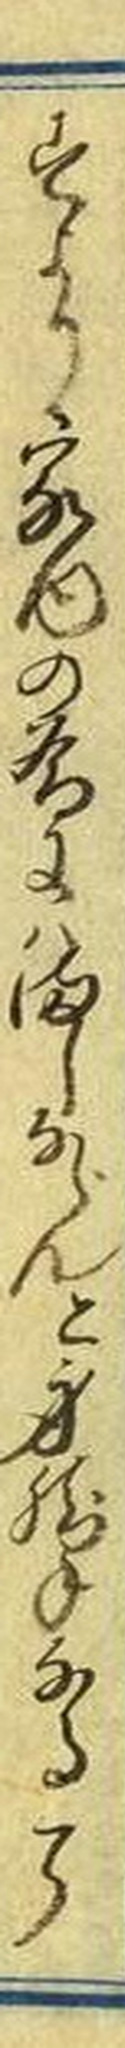すより家内の為にはましならんと身勝手なる了
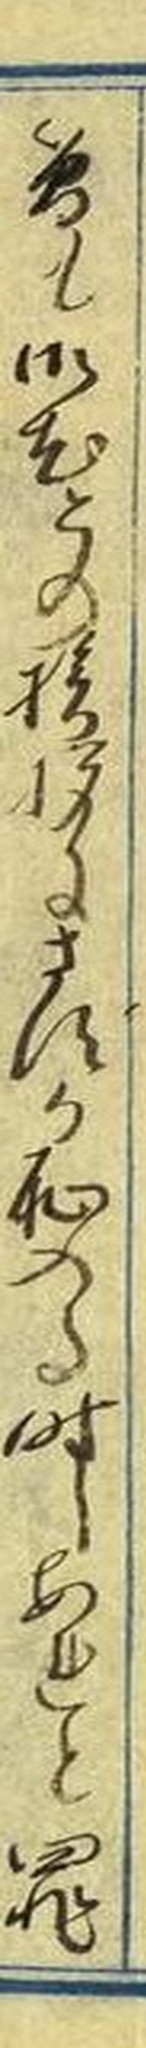簡も御尤との挨拶にさすか恥入る時しあれと罪
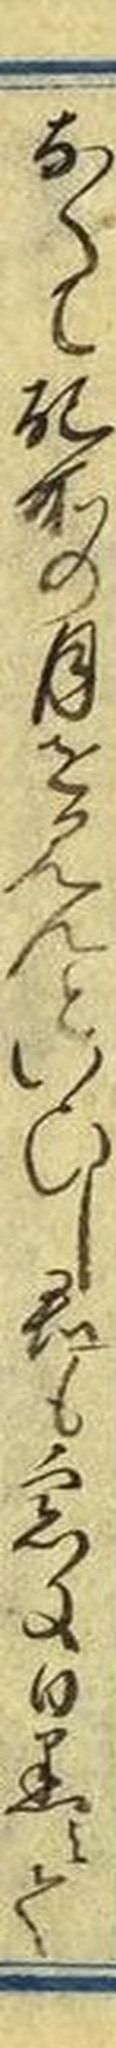なくて配所の月を見んといひし君も窓に日黒みて
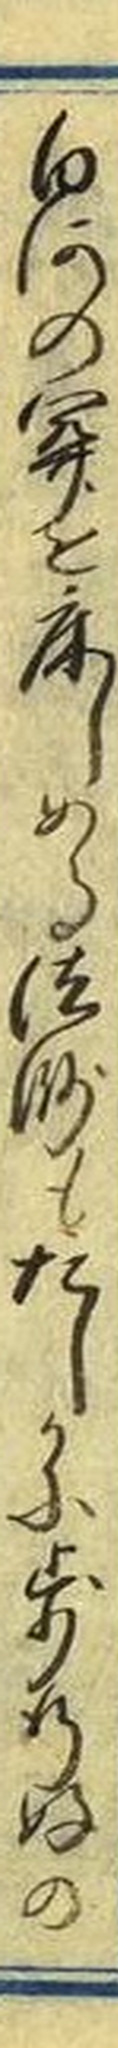白河の関を床しめる法師もたしかに歩行好の
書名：温古集 三巻
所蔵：福井県文書館 Fukui Prefectural Archives
